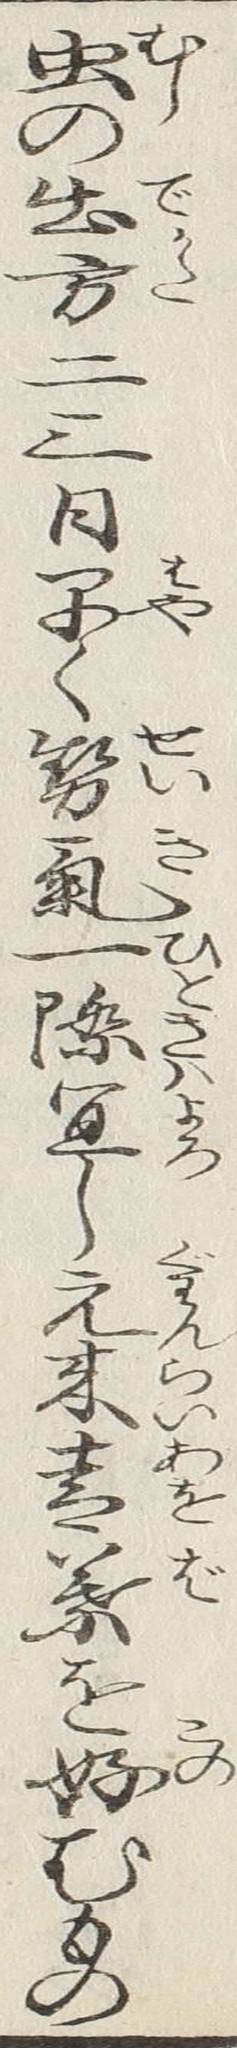虫の出方二三日早く勢気一際宜し元来青葉を好むもの
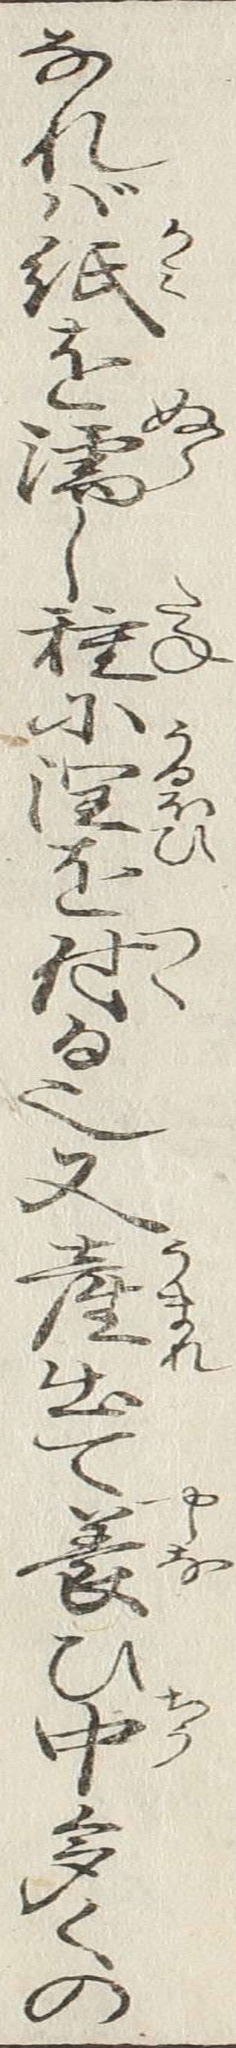なれば紙を濡し種に潤を付る也又産出て養ひ中多くの
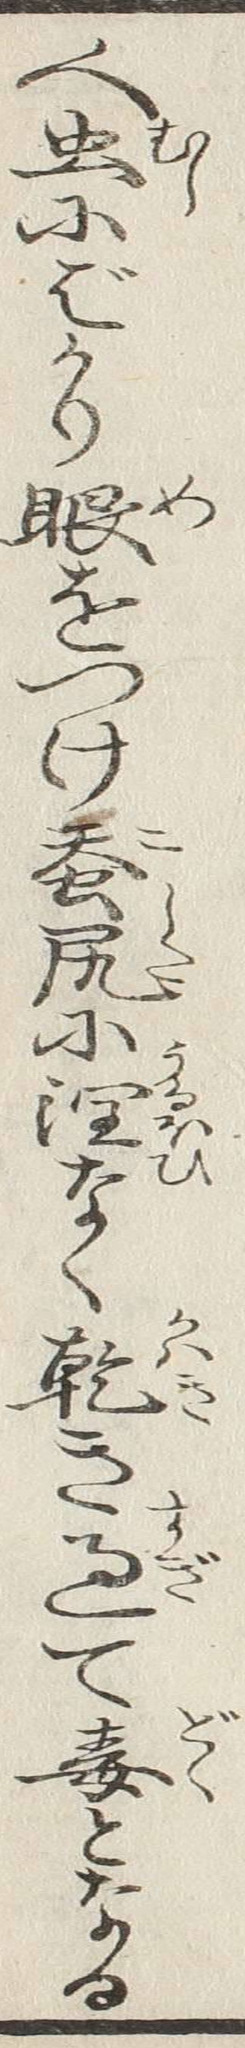人虫にばかり眼をつけ蚕尻に潤なく乾き過て毒となる

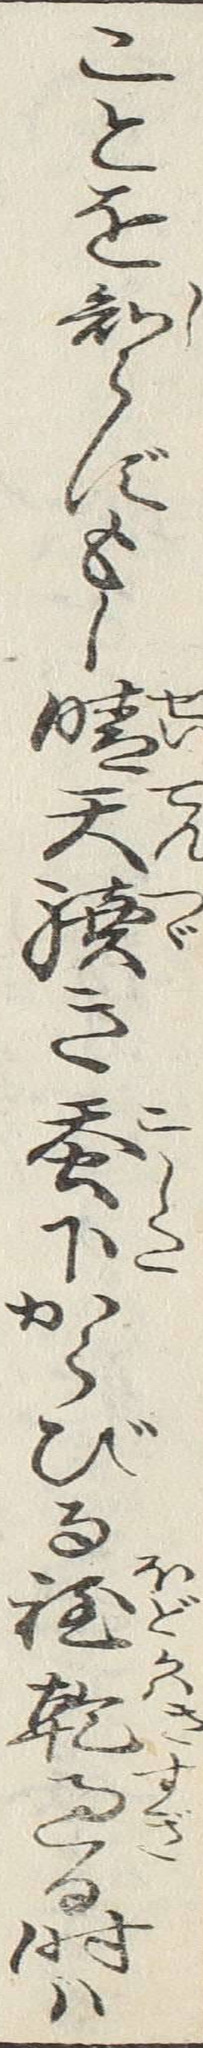ことを知らずもし晴天續き蚕下からびる程乾過る時は
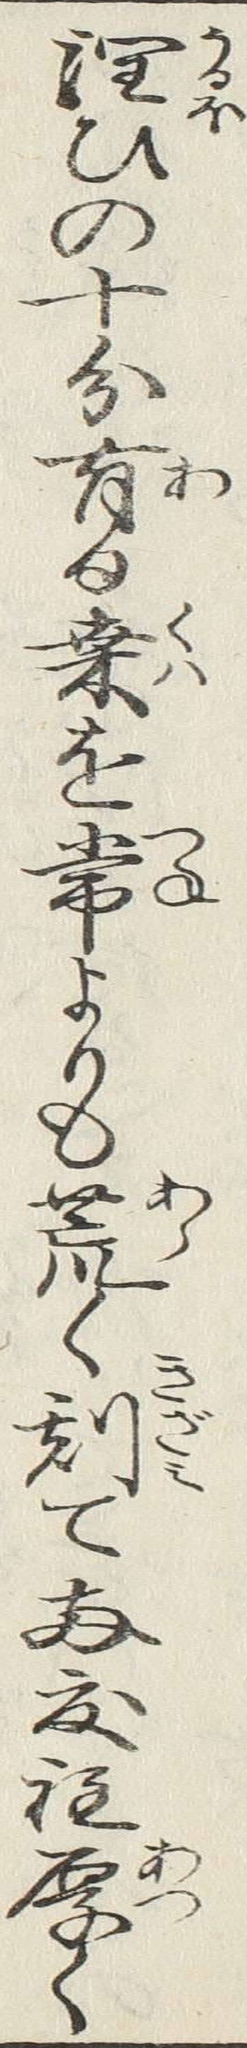潤ひの十分有る桑を常よりも荒く刻て両度程厚く
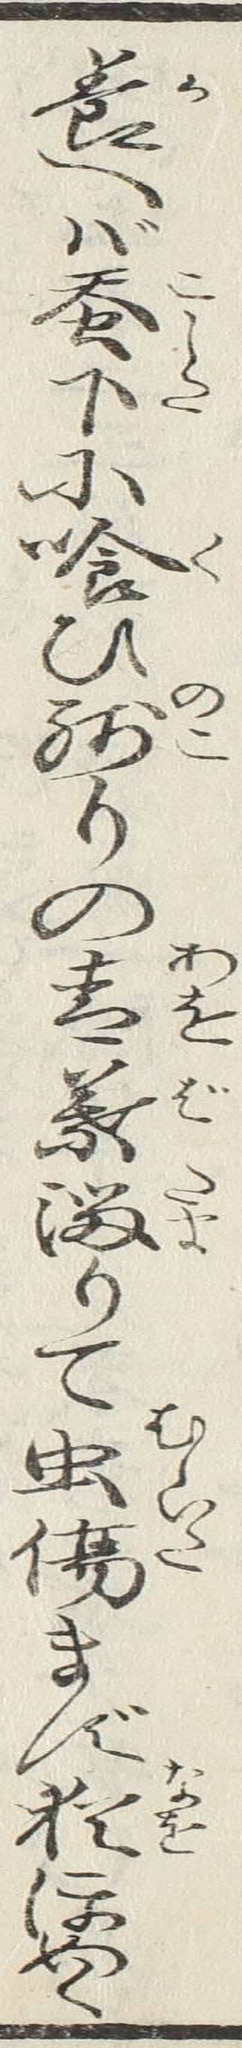養へば蚕下に喰ひ残りの青葉溜りて虫傷まず猶ほめく
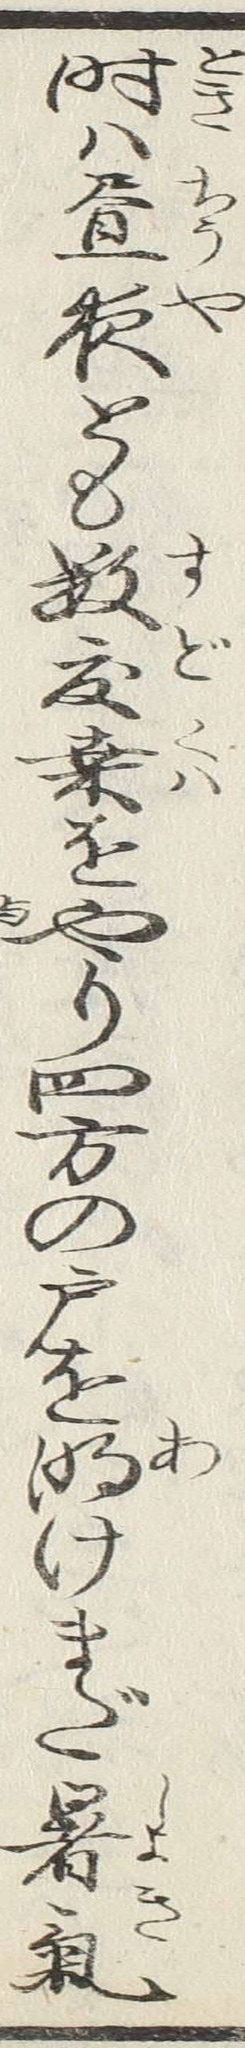時は昼夜とも数度桑をやり四方の戸を明けまだ暑気
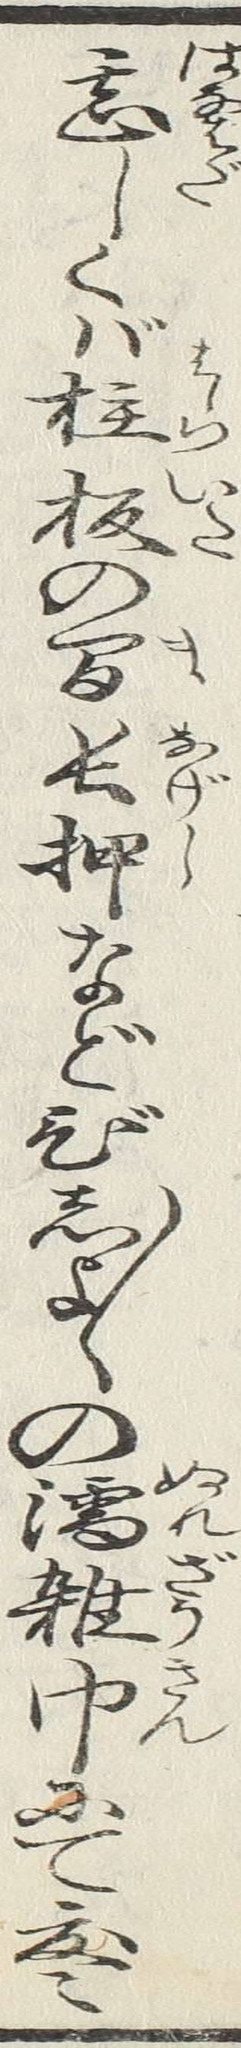甚しくば柱板の間長押などびしよ〳〵の濡雑巾にて度々
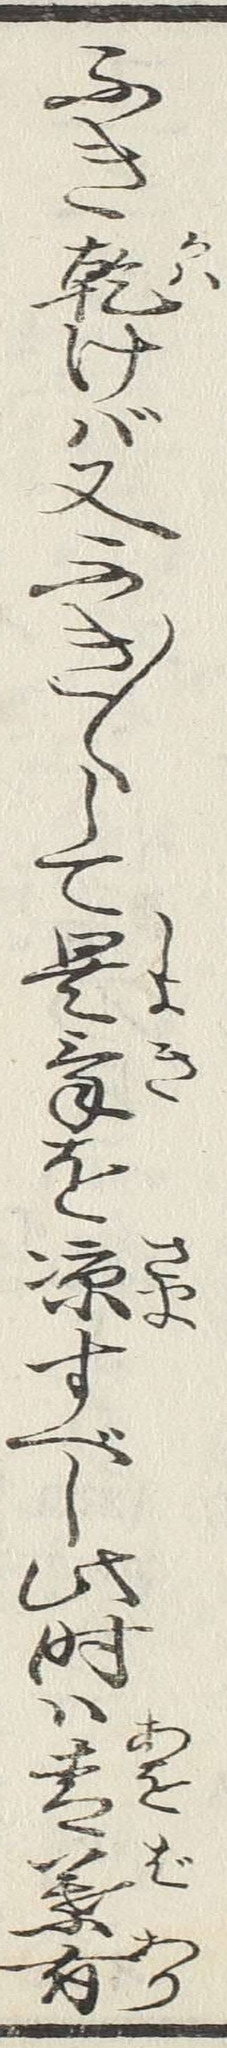ふき乾けば又ふき〳〵して暑気を涼すべし此時は青葉有
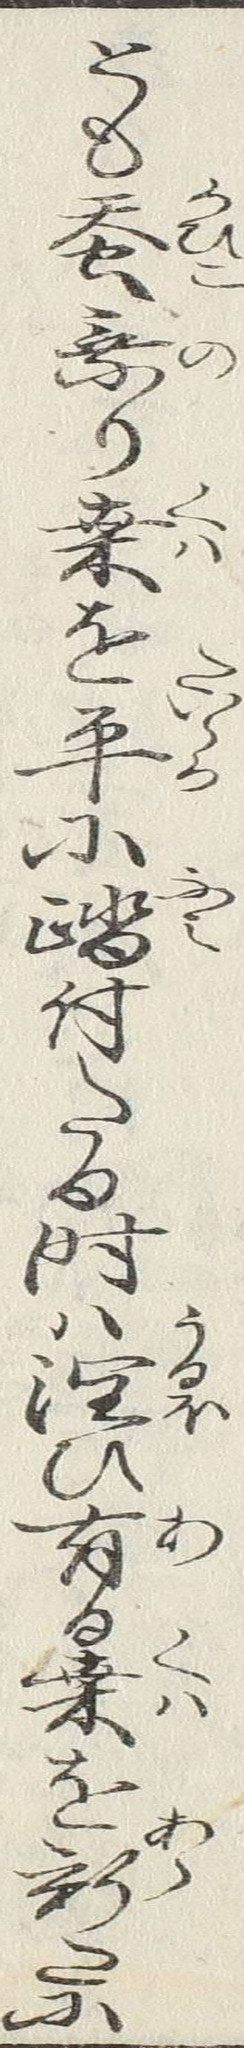とも蚕乗り桑を平に踏付たる時は潤ひ有る桑を新たに
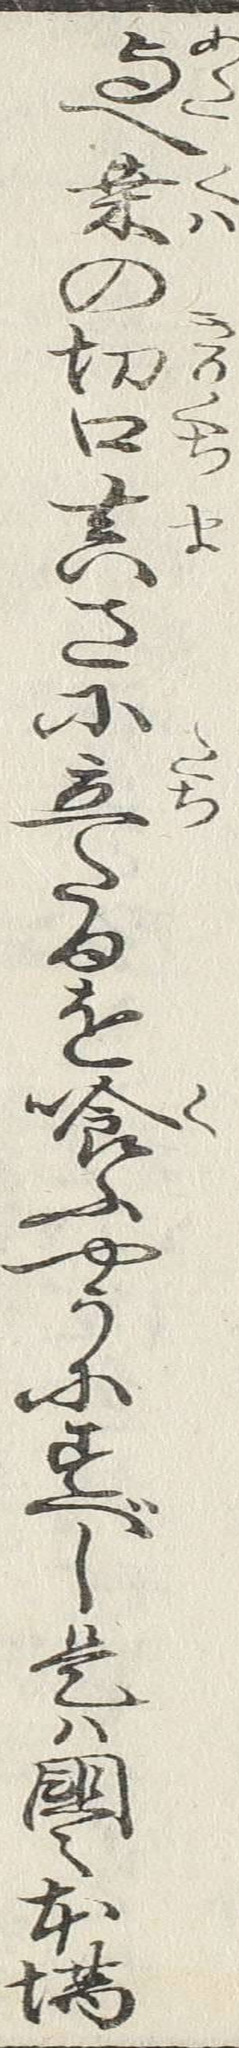与へ桑の切口真さに立たるを喰ふやうにすべし是は國々本場
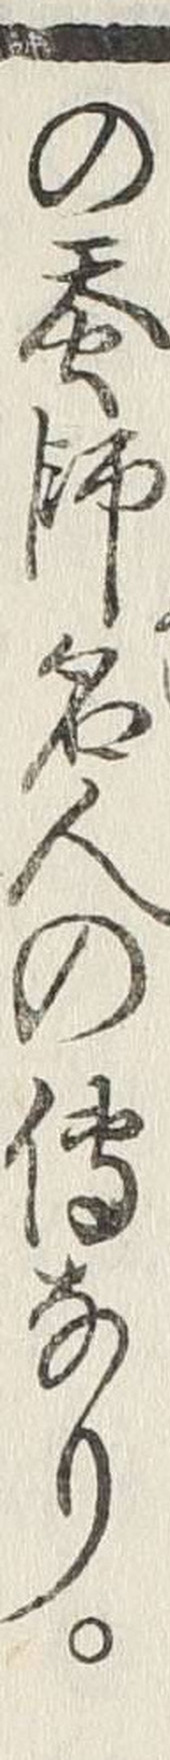の蚕師名人の傳なり。
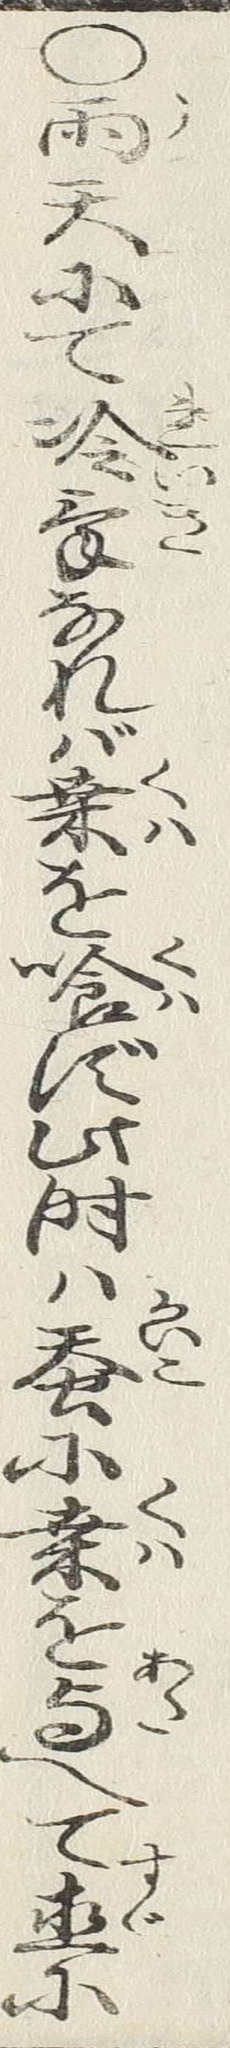○雨天にて冷気なれば桑を喰ず此時は蚕に桑を与へて直に
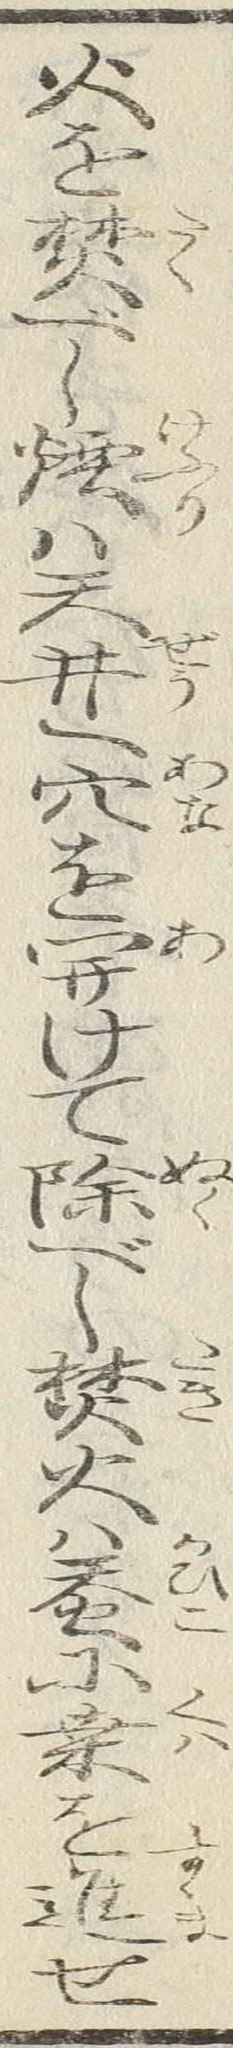火を焚べし煙は天井へ穴を開けて除べし焚火は蚕に桑を進せ
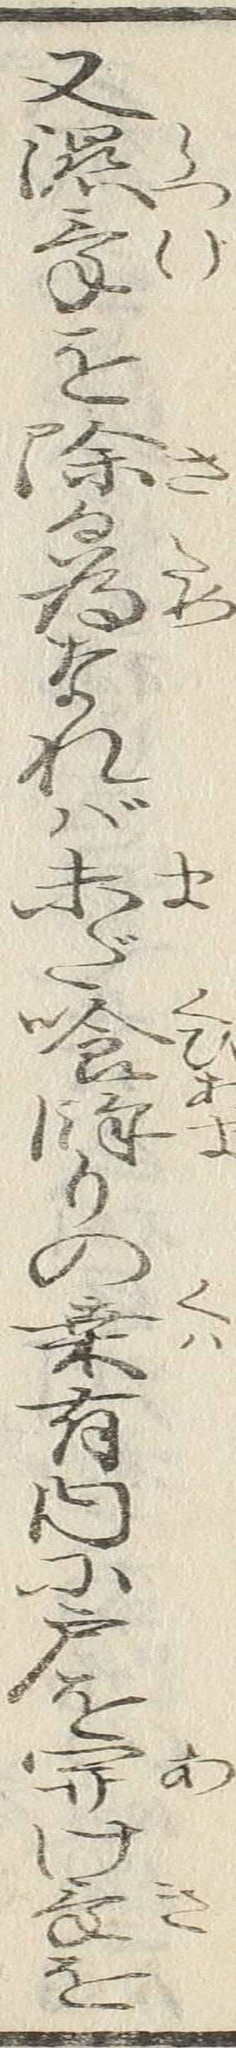又湿気を除る為なれば未だ喰餘りの桑有内に戸を開け気を
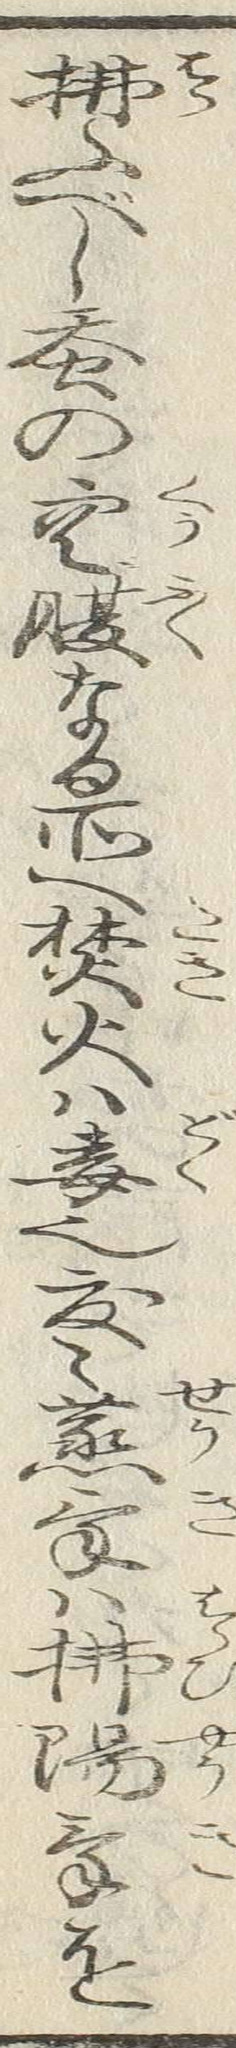拂ふべし蚕の空腹なる所へ焚火は毒也度々蒸気は拂陽気を
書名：養蠶實驗録
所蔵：東京大学農学生命科学図書館 国文学研究資料館
